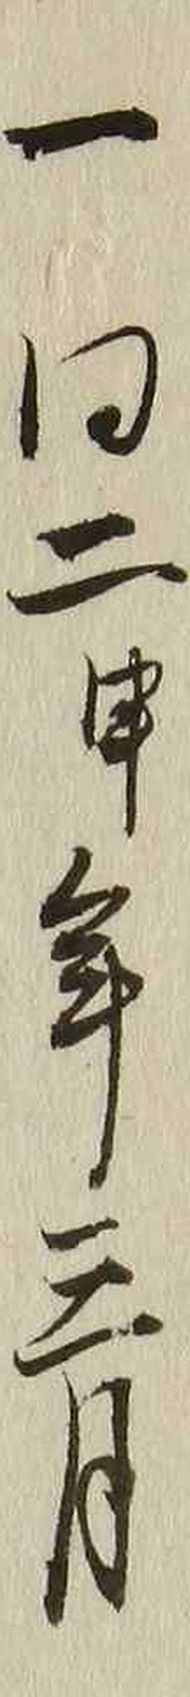一同二申年三月
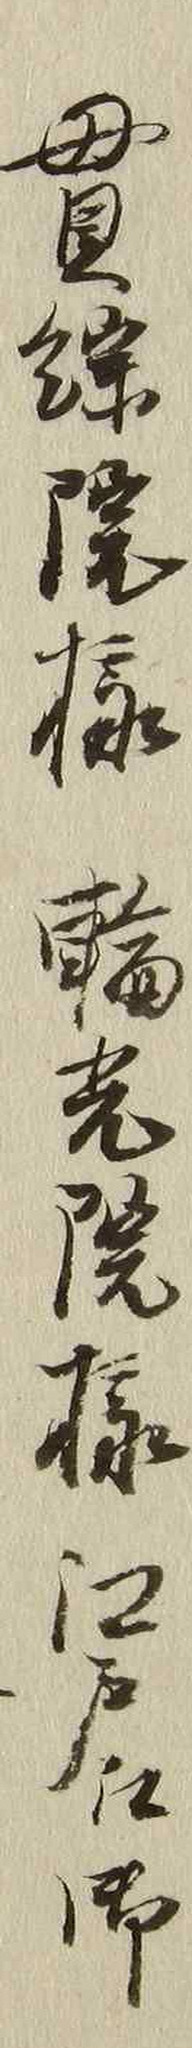貫綜院様輪光院様江戸江御
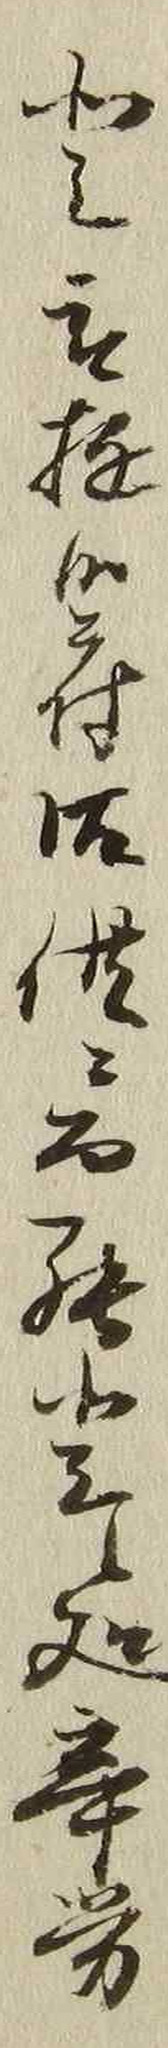登被遊候ニ付御供ニ而罷登候処辛労
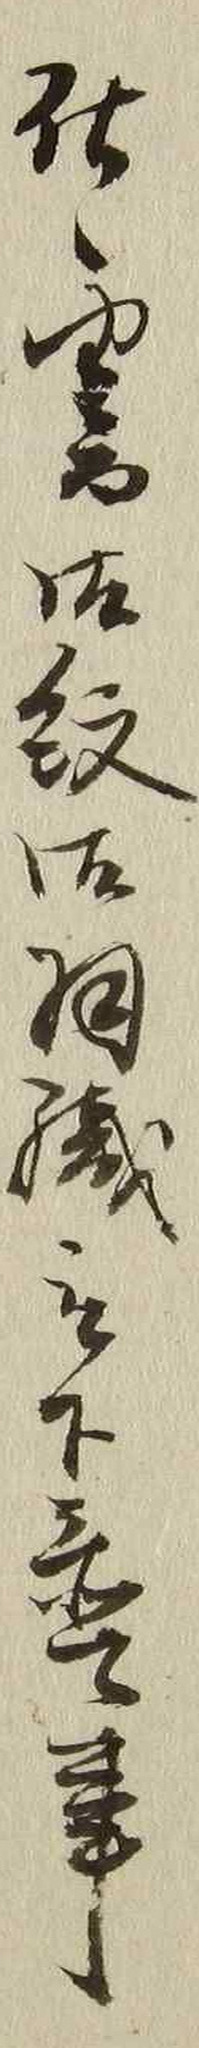仕候由ニ而御紋御羽織被下置候事
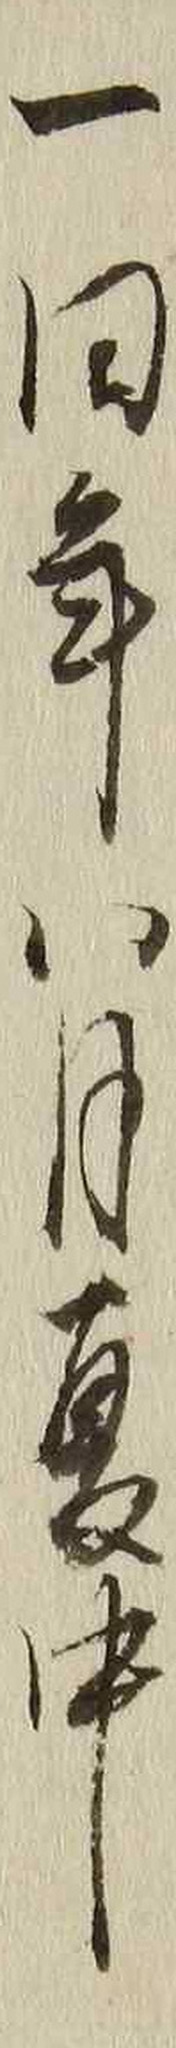一同年八月夏中
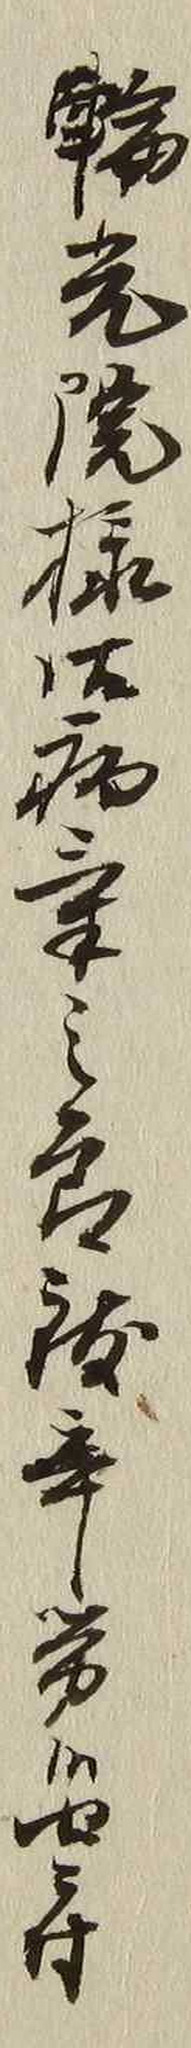輪光院様御病気之節致辛労候由ニ付
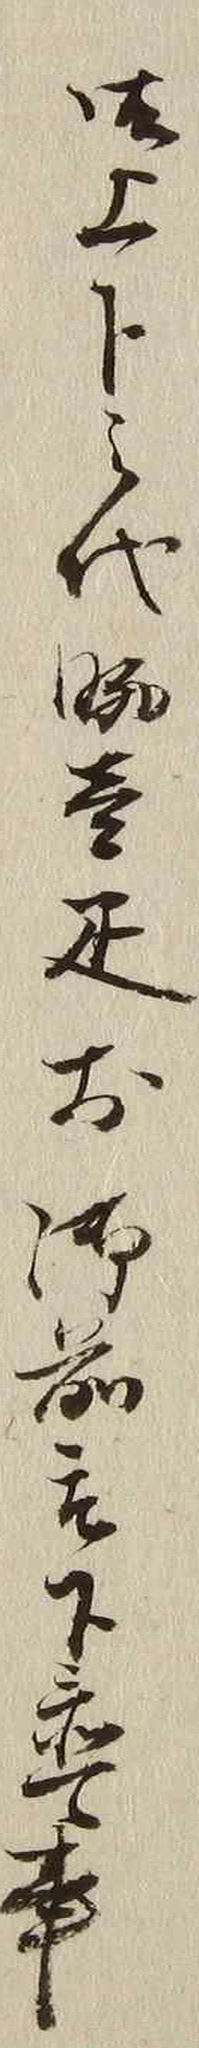御上下之代晒壱疋於御前被下置候事
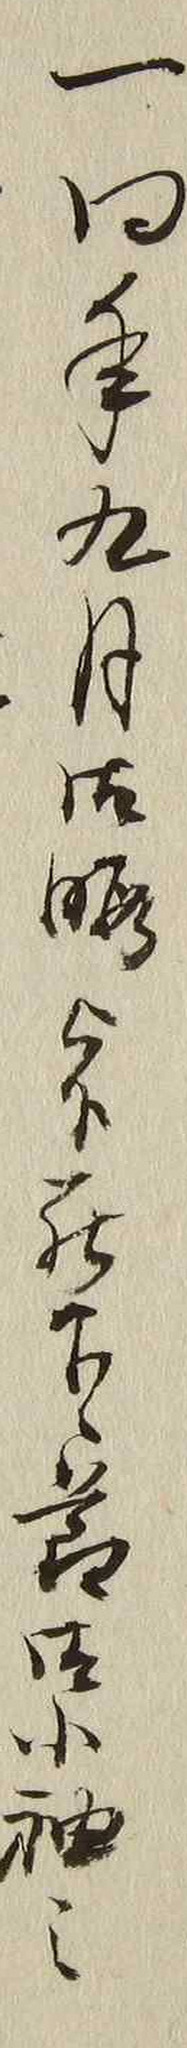一同年九月御暇被下罷下候節御小袖之
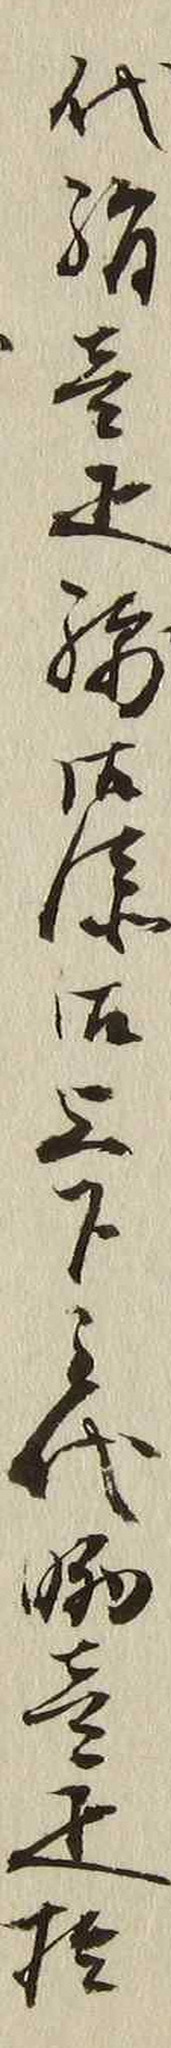代絹壱疋綿御添御上下之代晒壱疋於
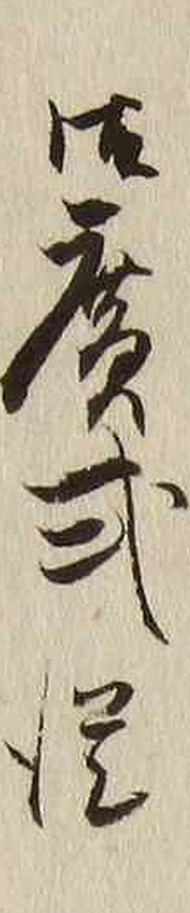御広式従
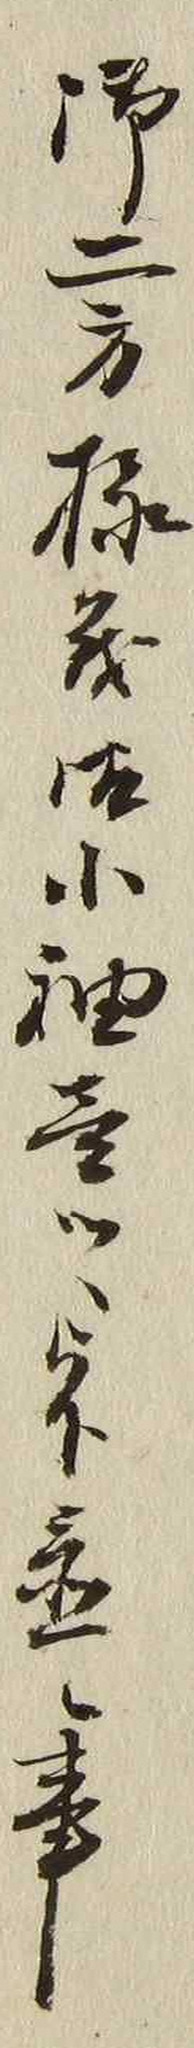御二方様茂御小袖壱ツヽ被下置候事
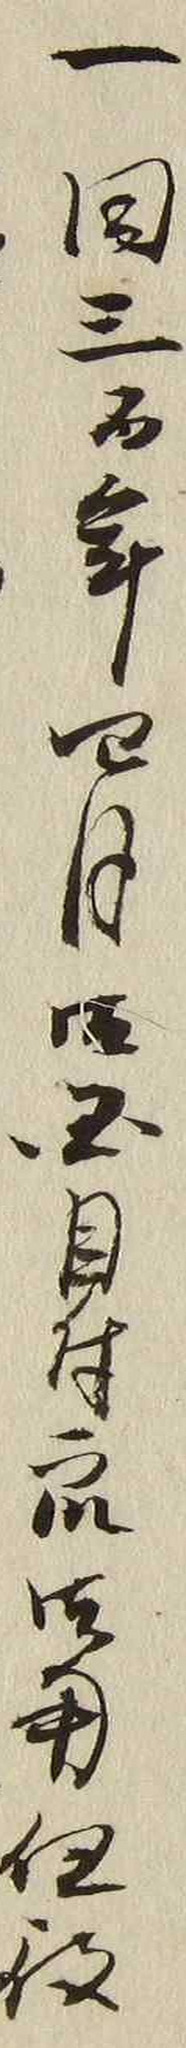一同三酉年四月御国目付衆御用任役
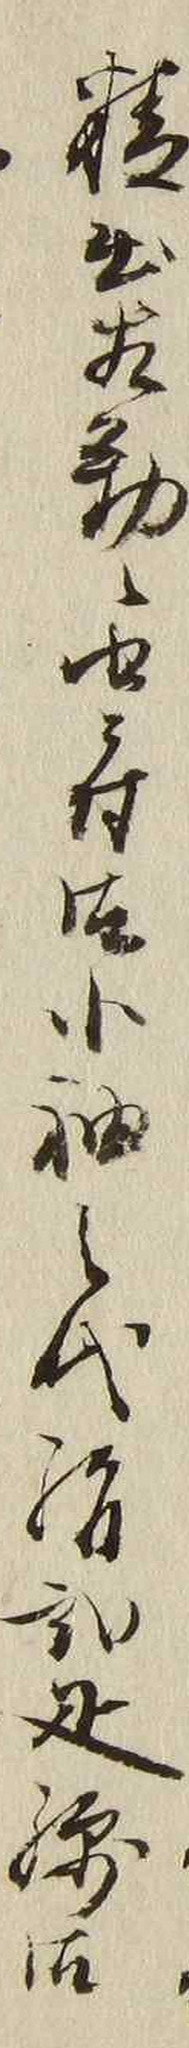精出相勤候由ニ付御小袖之代絹弐疋綿御
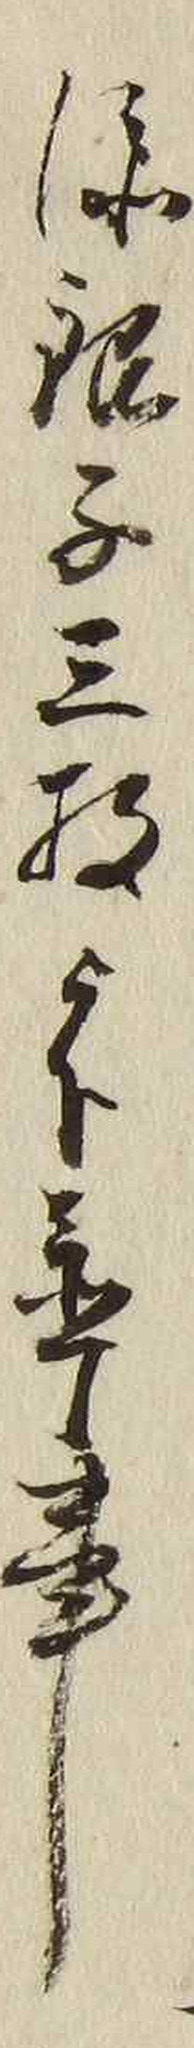添銀子三枚被下置候事
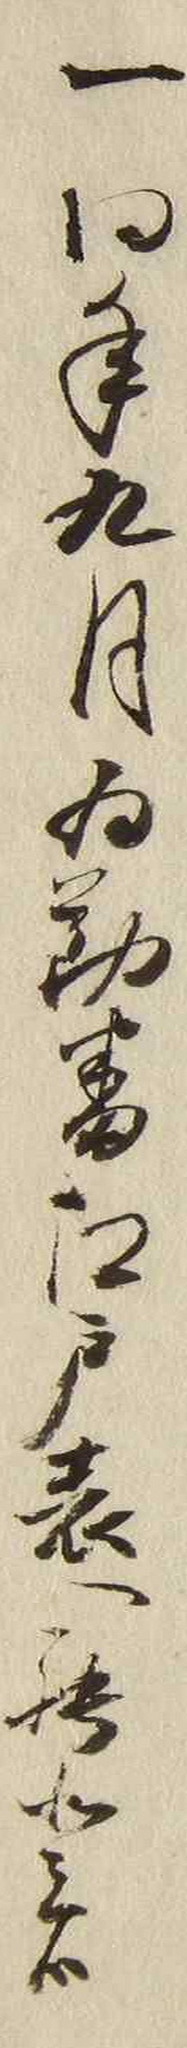一同年九月為勤番江戸表へ罷登候

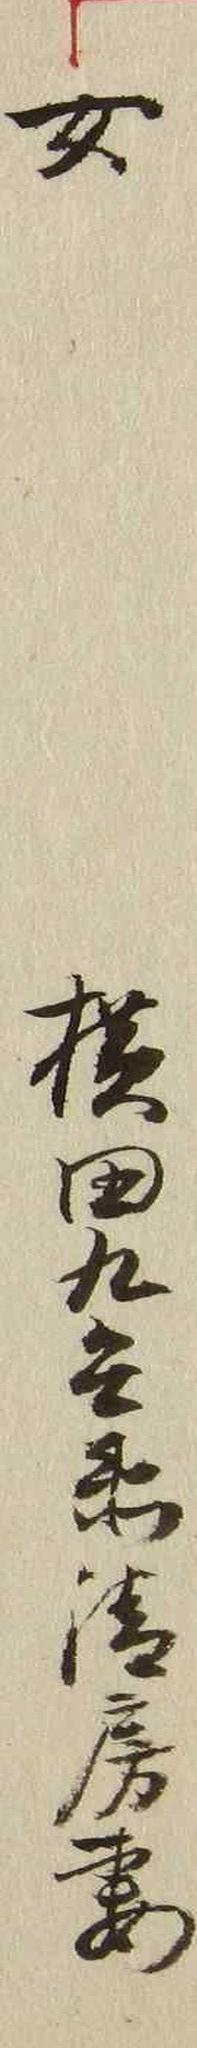女横田九兵衛清房妻
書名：諸士系譜　巻之348　も之部4
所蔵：会津若松市立会津図書館
